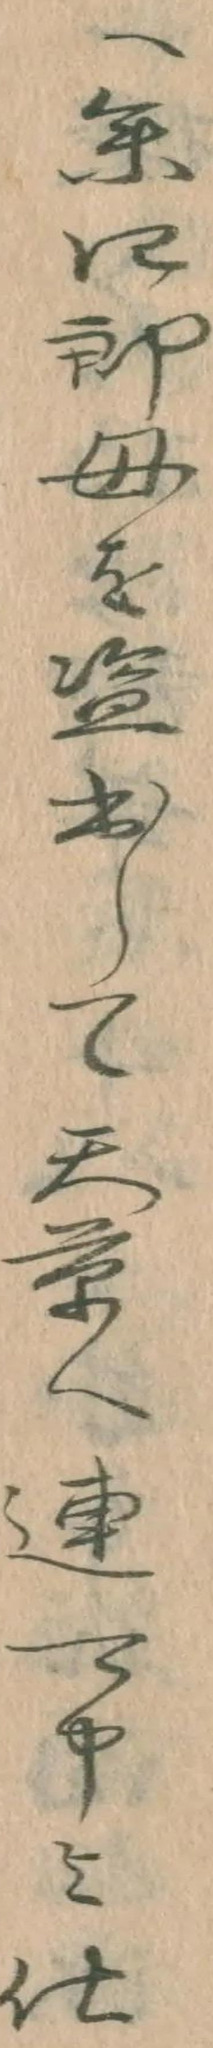へ参四郎母を盗出して天草へ連可申与仕
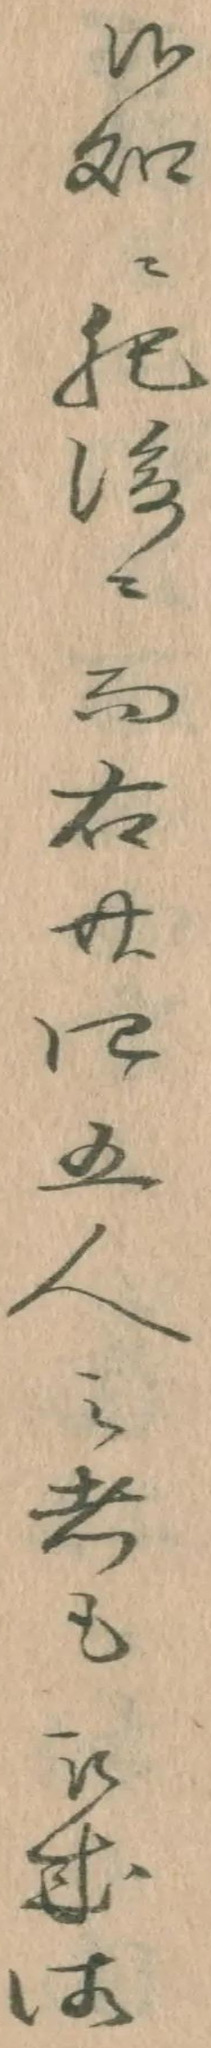候処に肥後に而右廿四五人之者も被成御
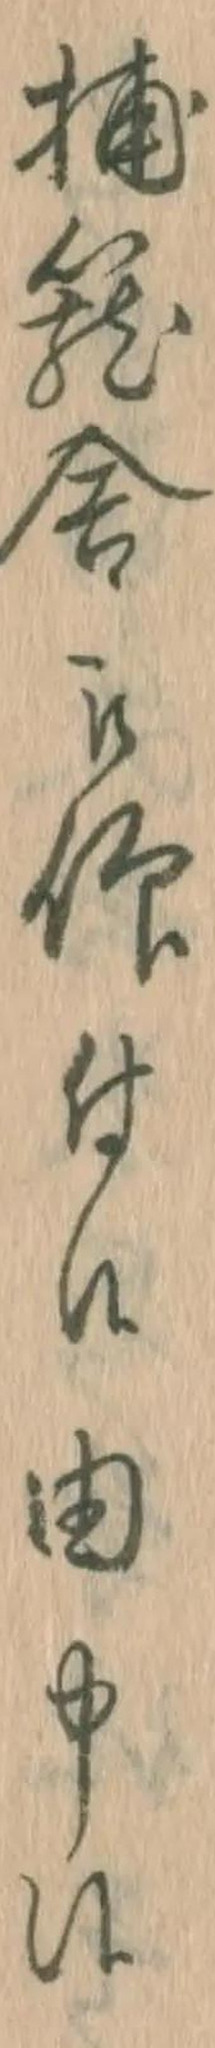捕籠舎被仰付候由申候
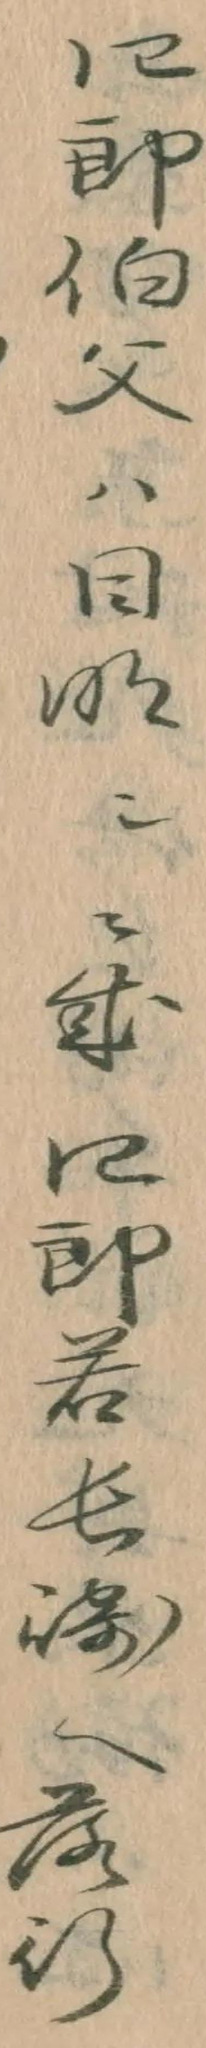一四郎伯父は目明しに成四郎若長崎へ落行
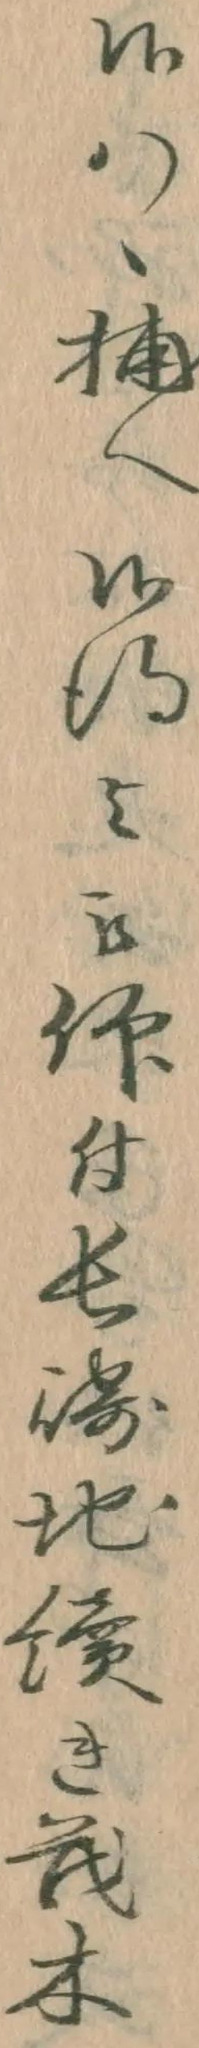候はゝ捕へ候得与被仰付長崎地続き茂木
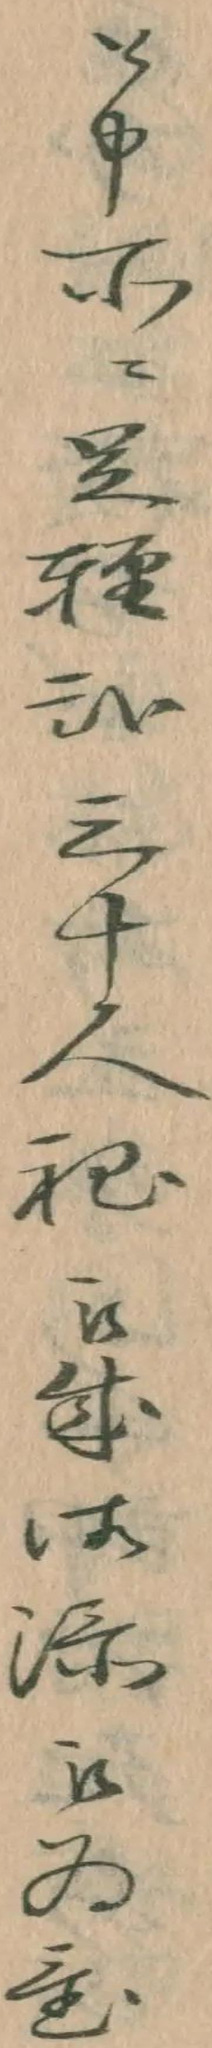と申所に足軽弐三十人程被成御添被ゐ置
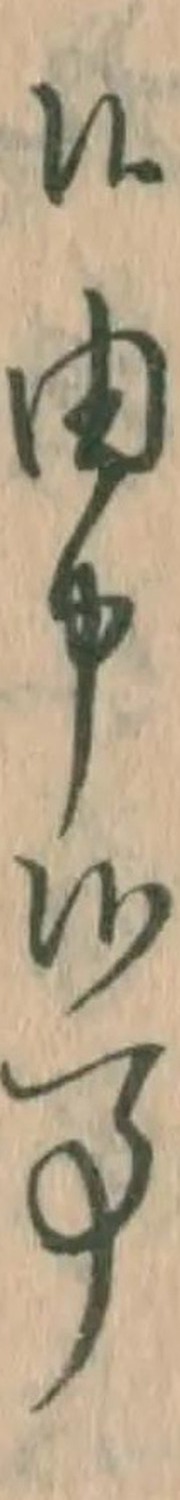候由申候事
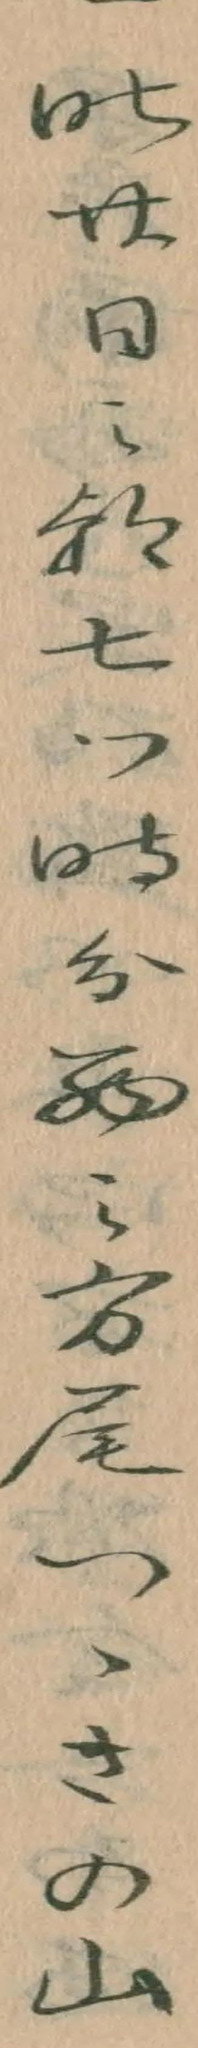一昨廿日之朝七つ時分西之方尾つゝきの山
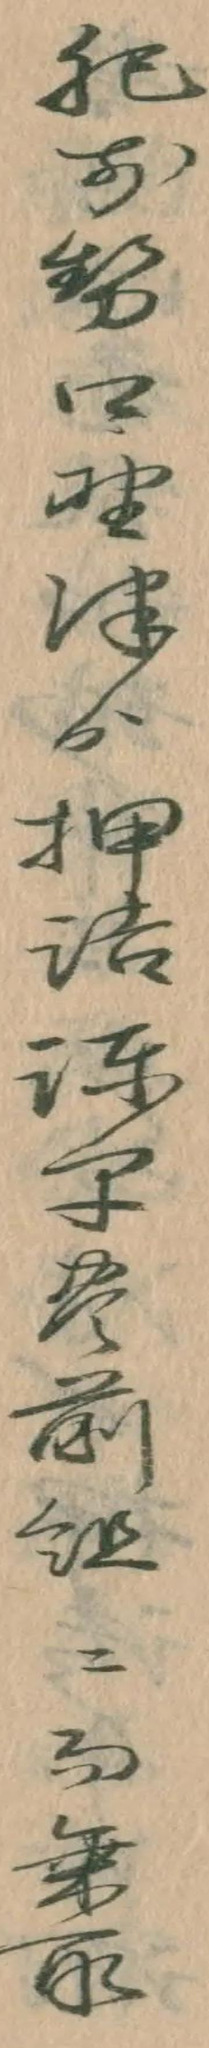肥前勢口野津ゟ押詰諌早豊前組に而乗取
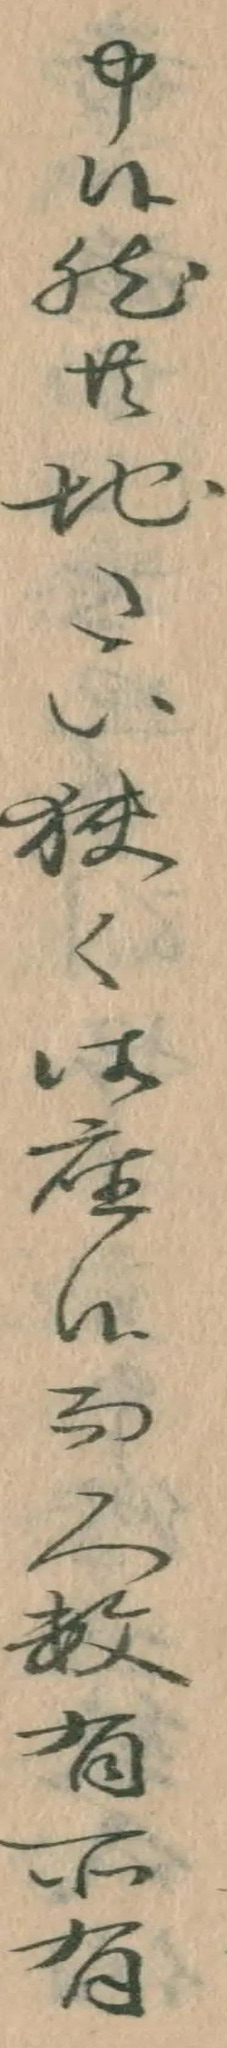申候然共地たい狭く御座候而人数有所有
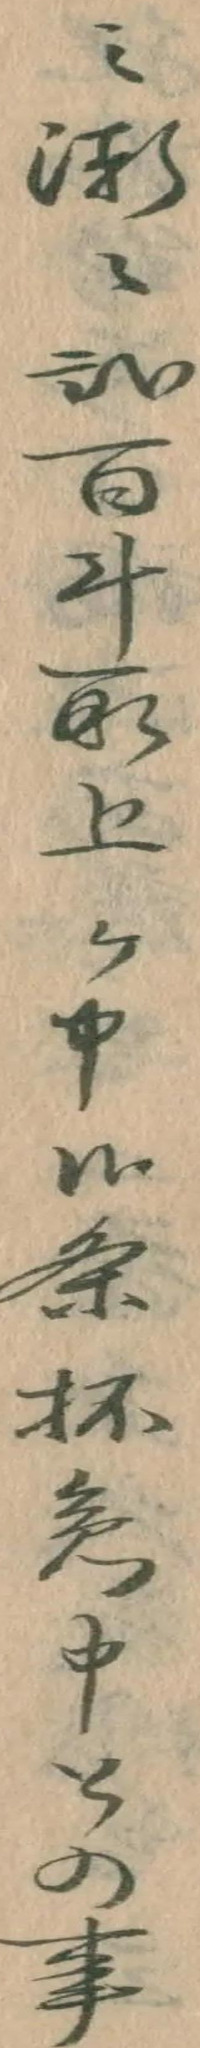之瀬に弐百斗取上け申候条抔急申との事
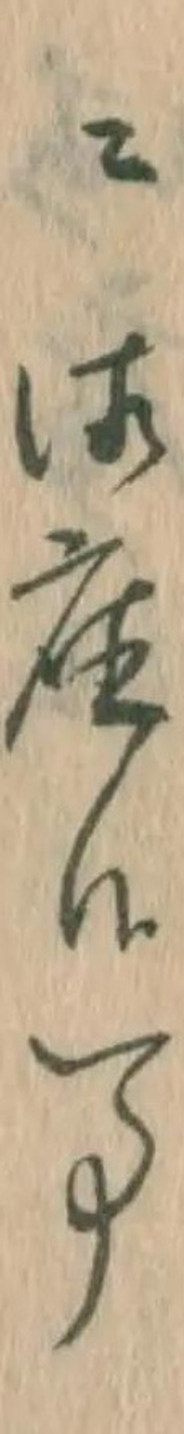に御座候事
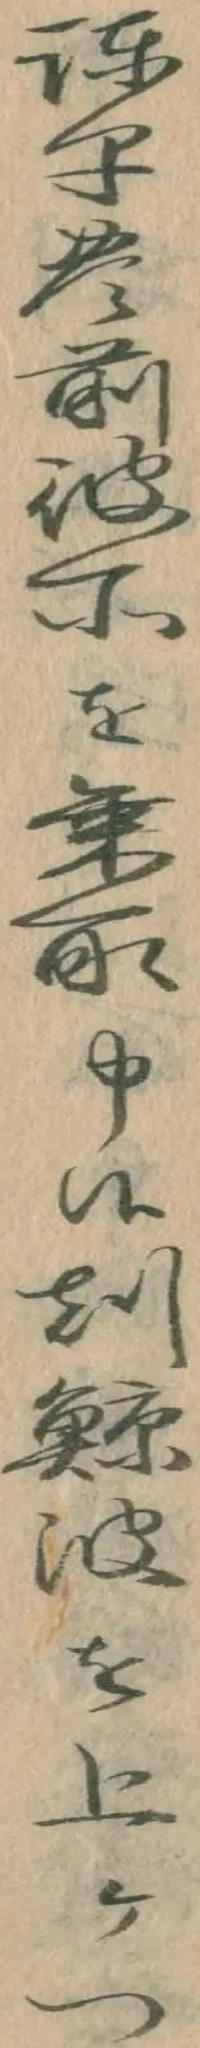一諌早豊前彼所を乗取申候刻鯨波を上けつ
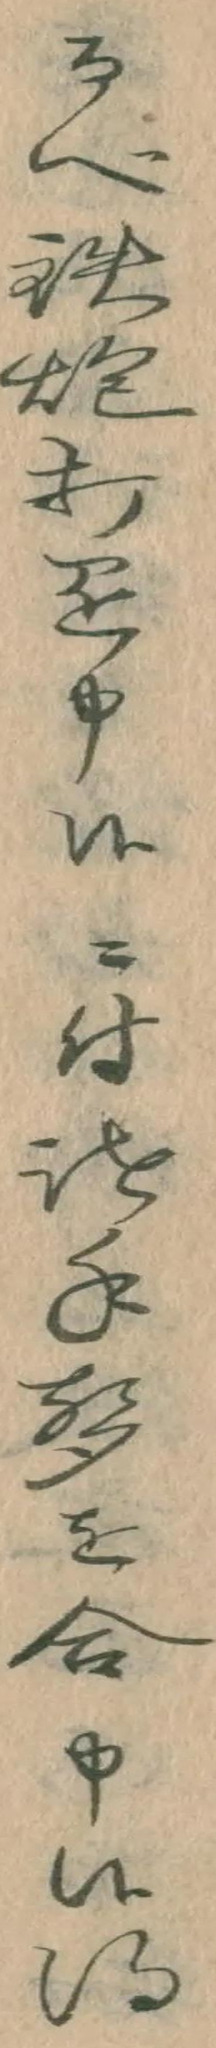るべ鉄炮打懸申候に付諸手声を合申候得
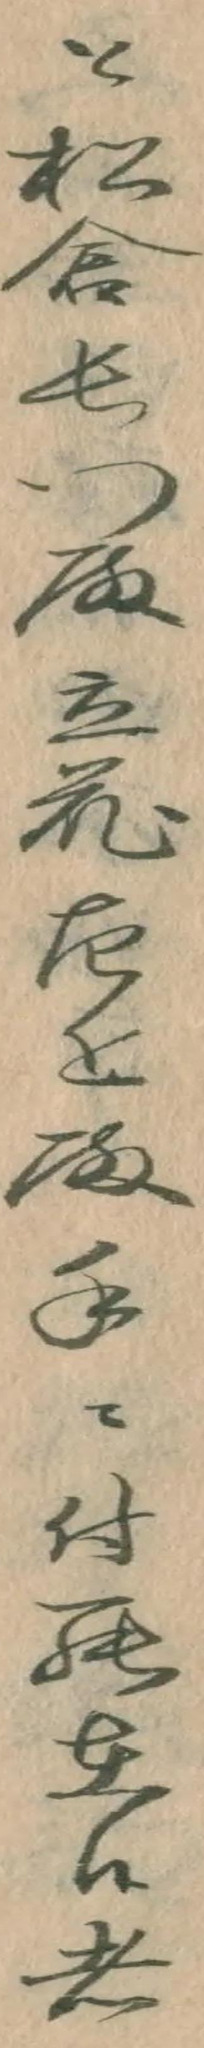と松倉長門殿立花左近殿手に付罷在候者
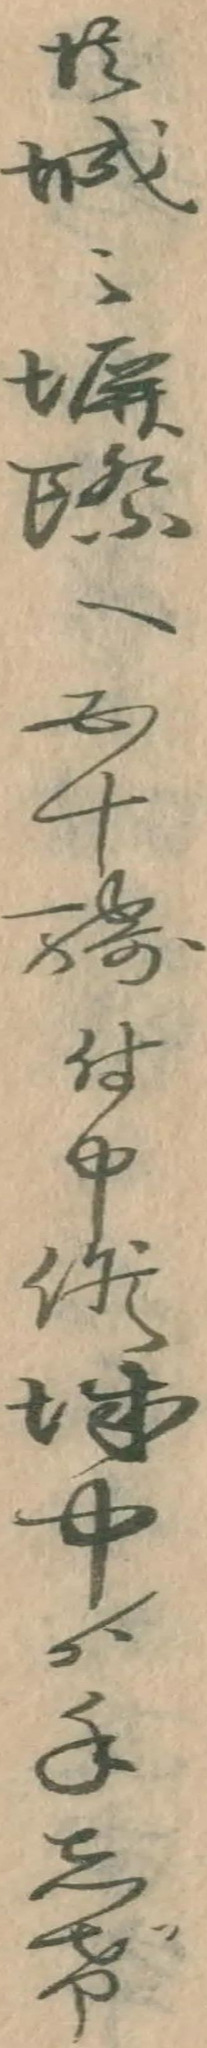共城之塀際へ五十騎付申候城中ゟ手志希
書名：切支丹御退治記 49巻. [4]
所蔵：国立国会図書館 National Diet Library, JAPAN
